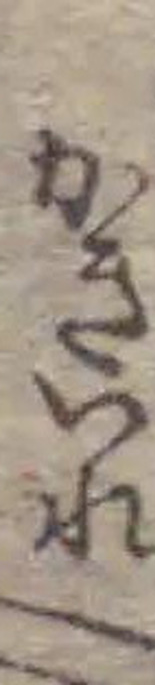かきいれ
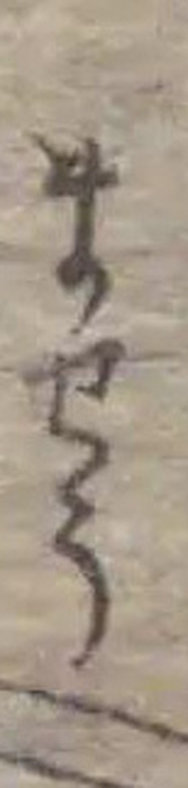ませう
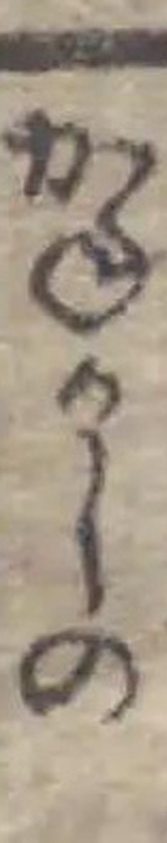かねかしの
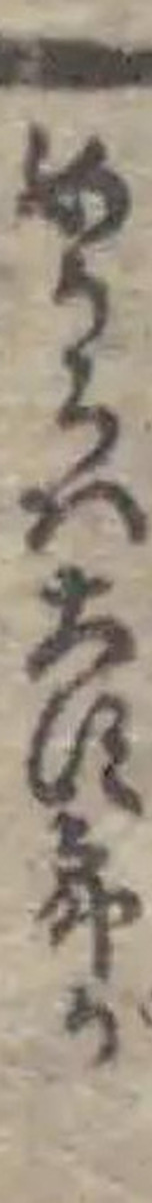むからは大次郎が
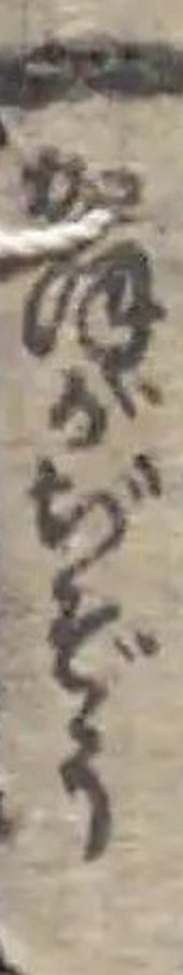かほがぢぞう
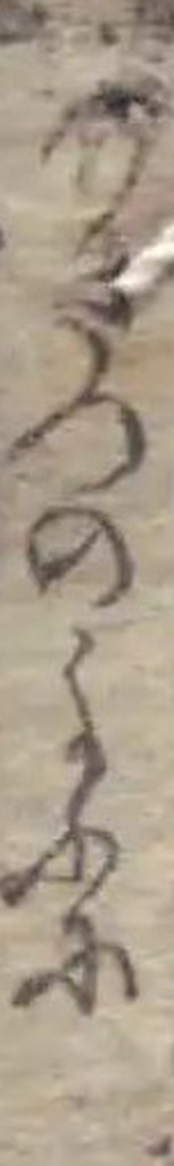ぼさつのよふに
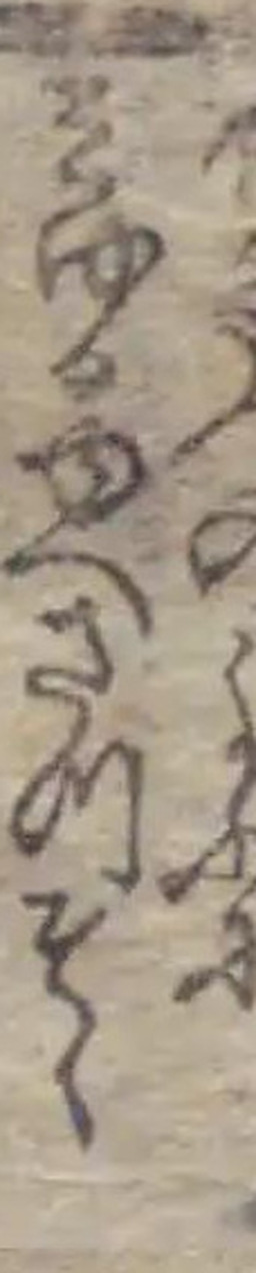みゆるゆへさつそく
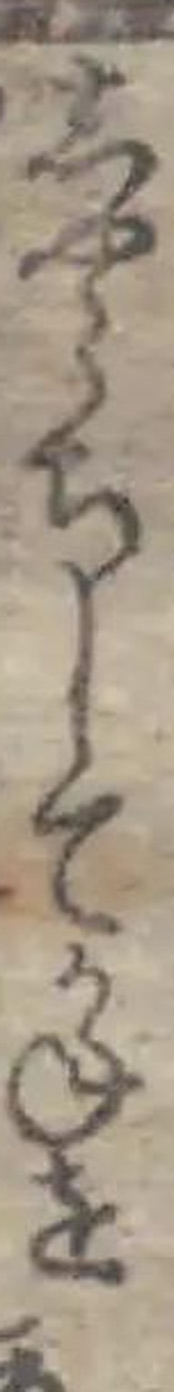しやうちしてかねを
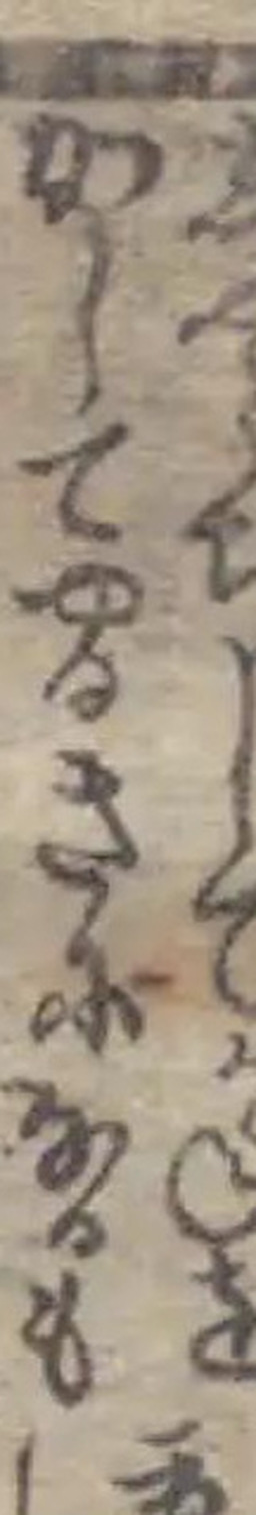かしてやるきになるも
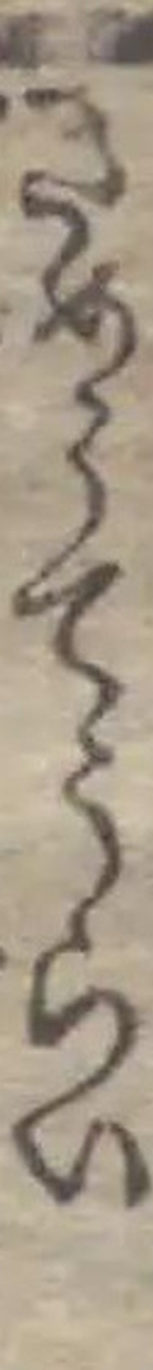きめうてうらい
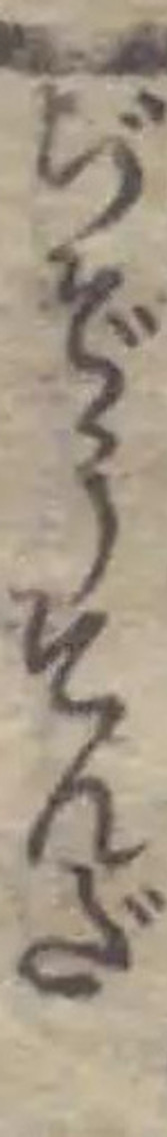ぢぞうそんだ
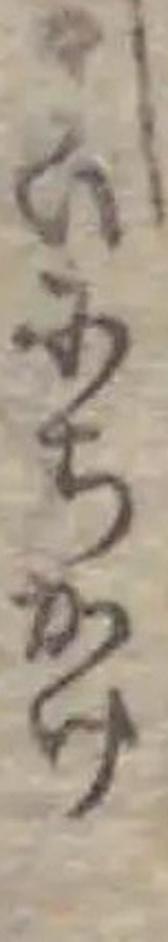〽まいにちかけ
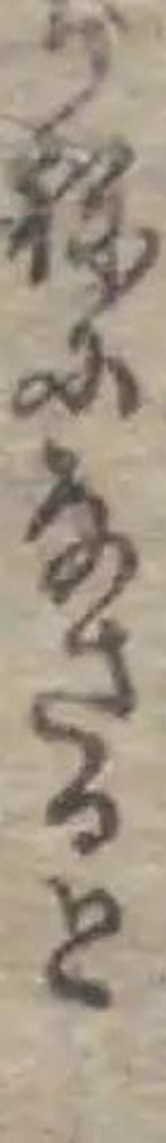がねになさると
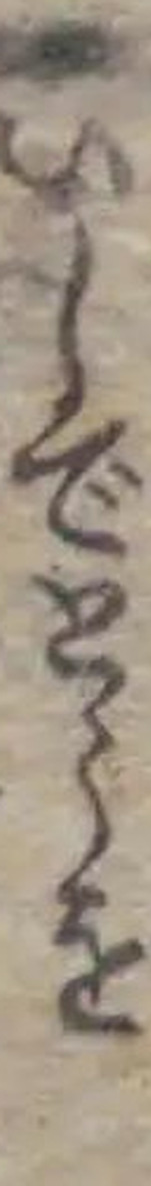いしでとうを
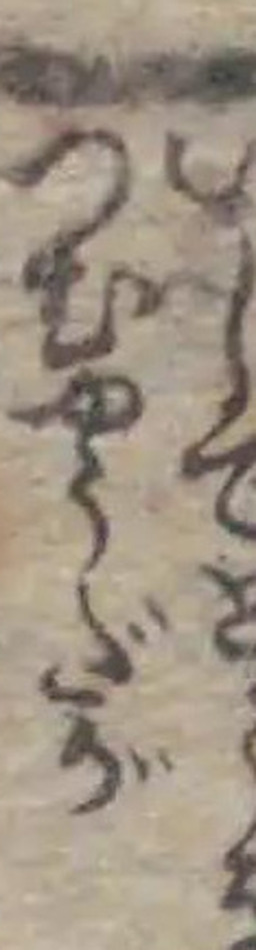つむやうだが
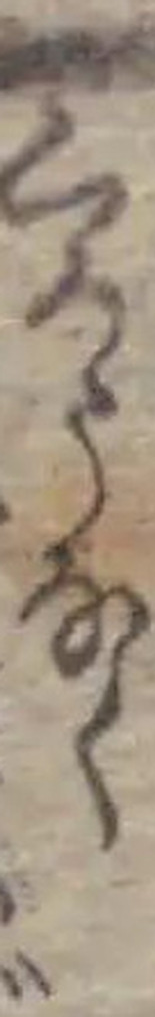くろうなく
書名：福壽海旡量品玉 3巻
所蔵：国立国会図書館 National Diet Library, JAPAN
